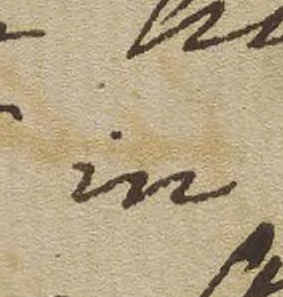in
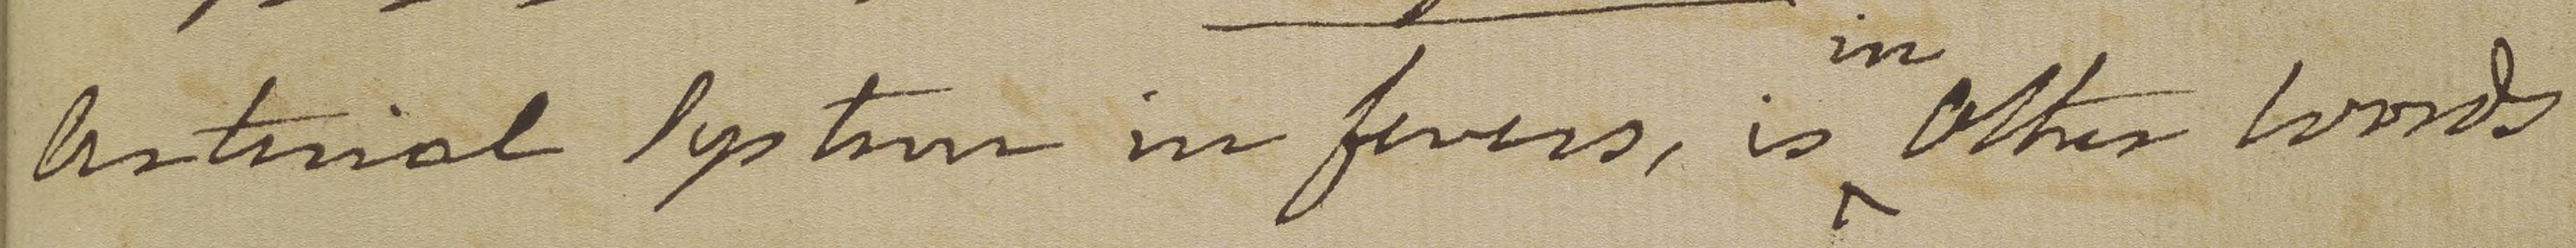arterial system in fevers, is ^ other words
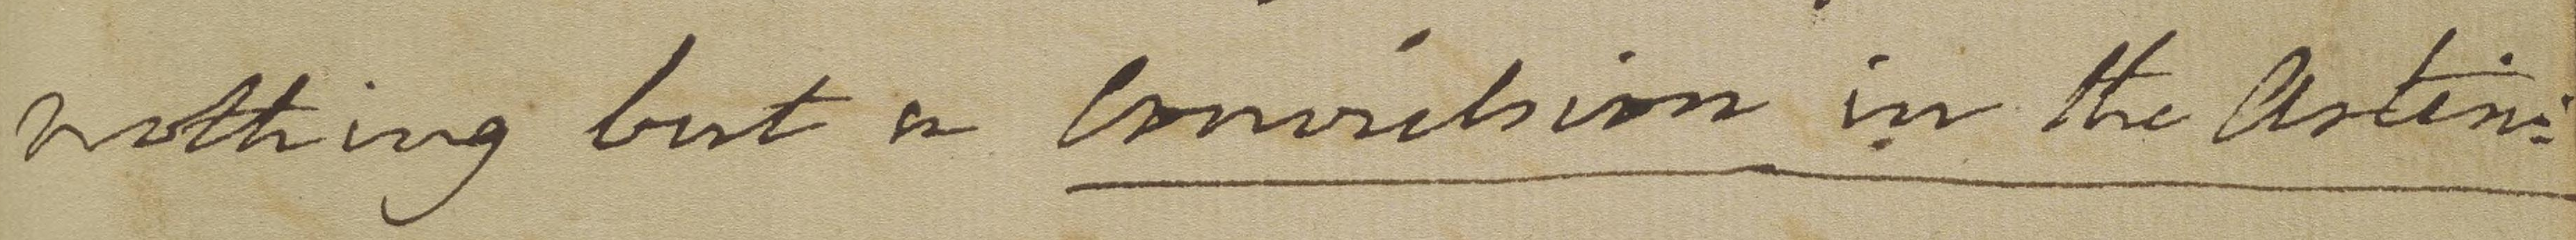nothing but a convulsion in the ateri-
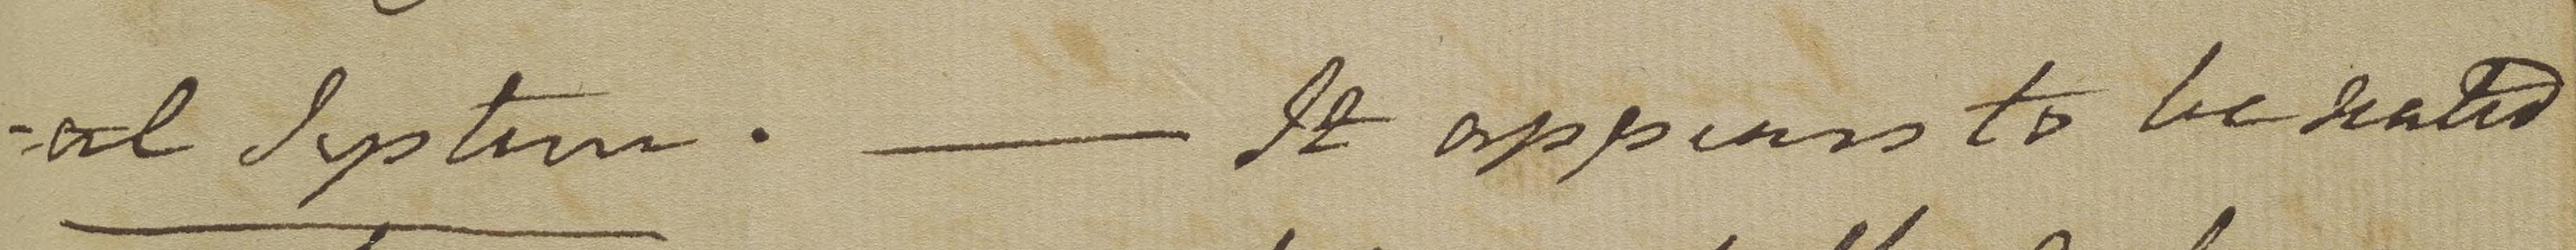al system. It appears to be seated
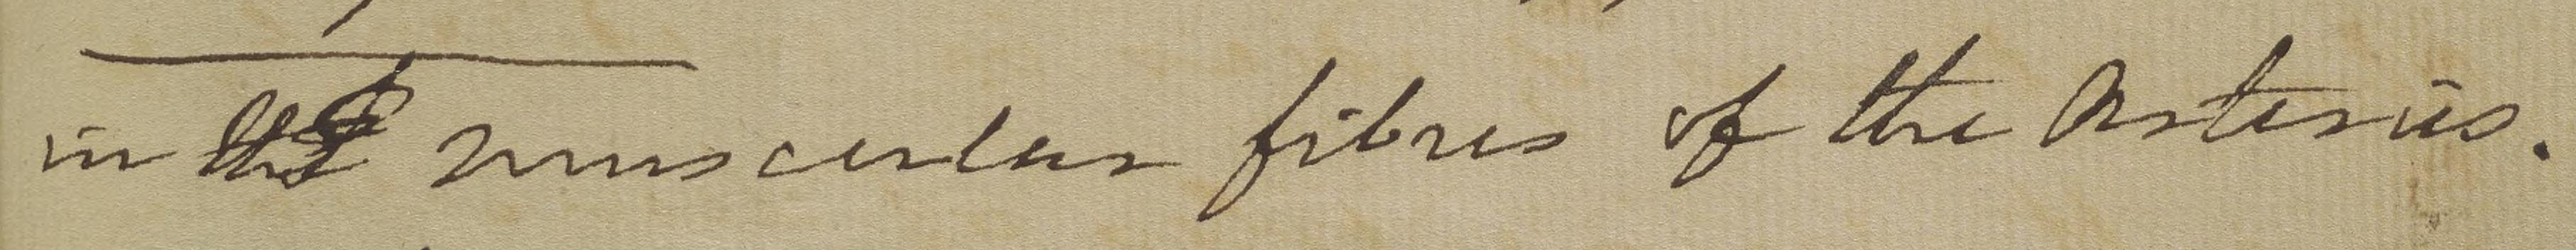in [the] muscular fibres of the arteries.
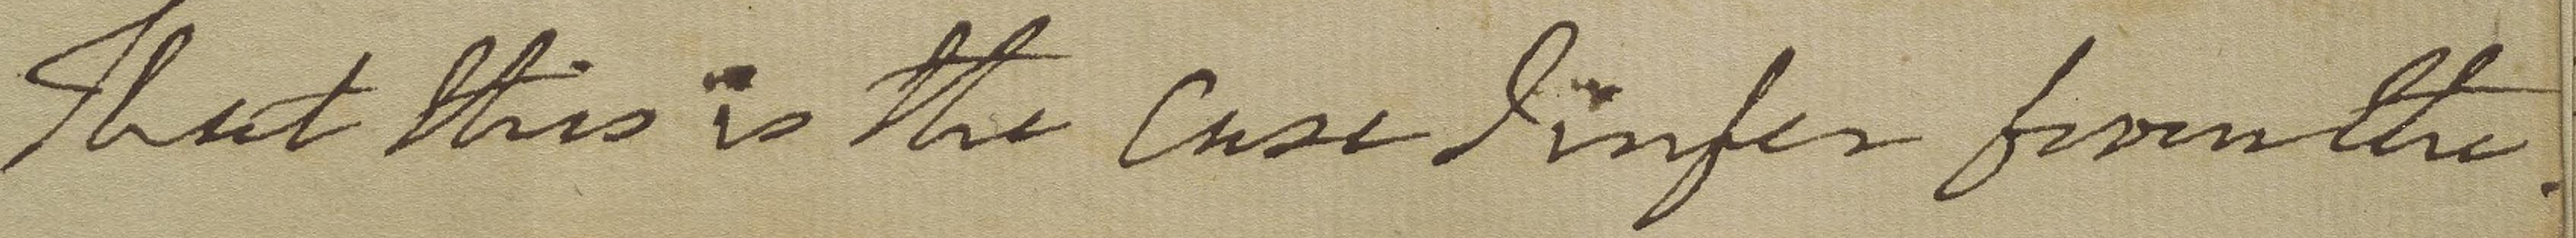That this is the cause I infer from the
